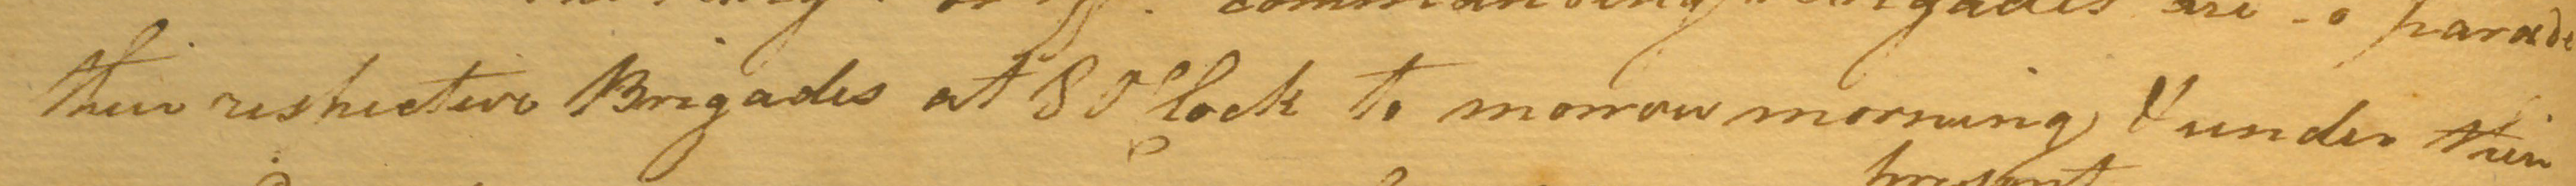their respective Brigades at 8 OClock to morrow morning & under their
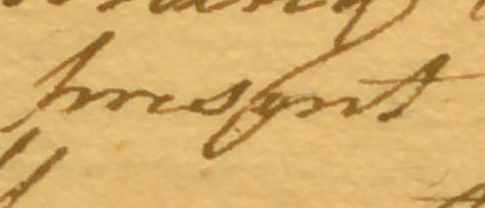present
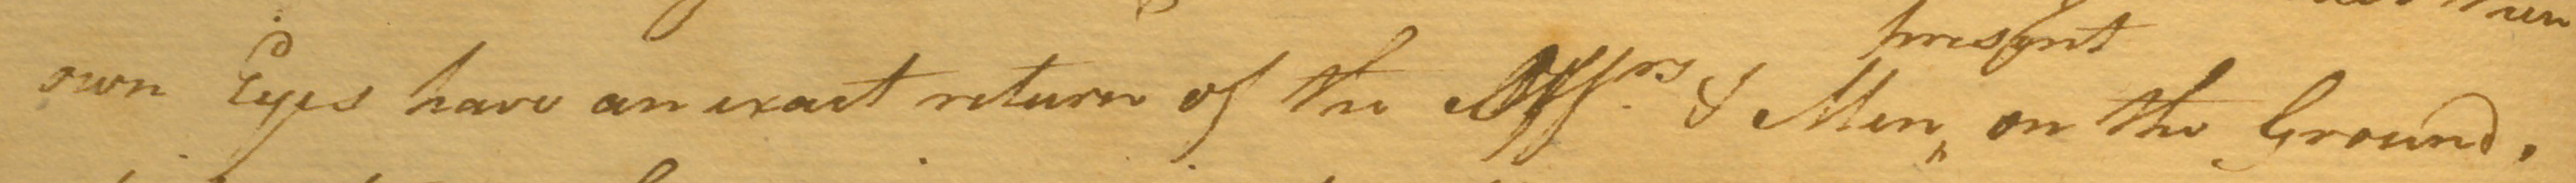own Eyes have an exact return of the Off^rs. & Men ^ on the Ground,
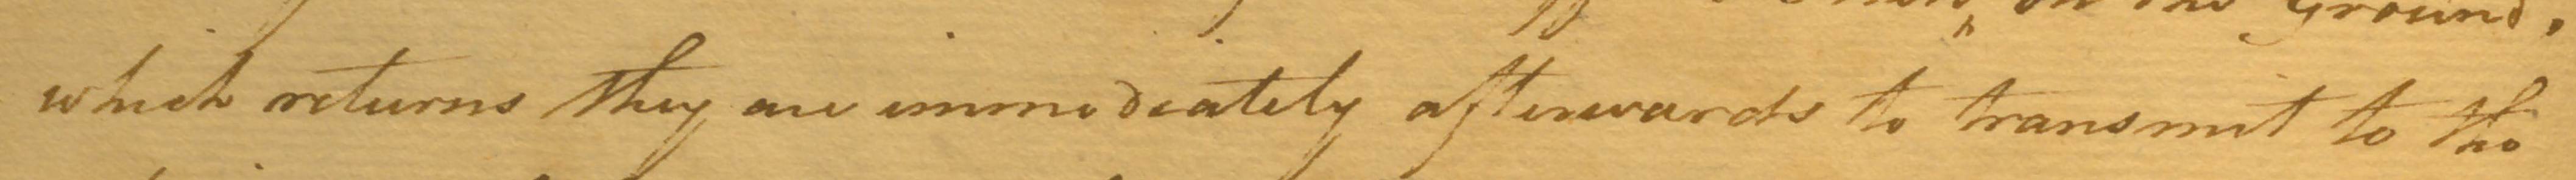which returns they are immediately afterwards to transmit to the
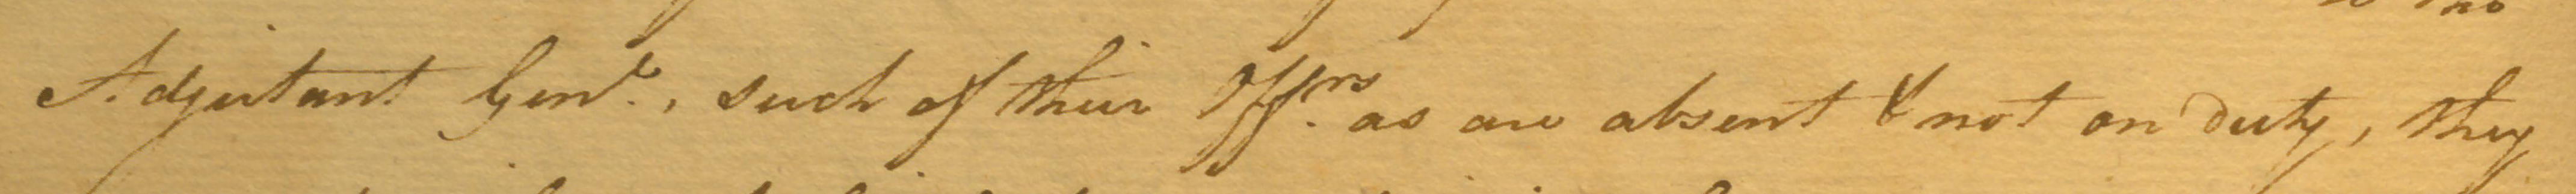Adjutant Gen^l., such of their Off^rs. as are absent & not on duty, they
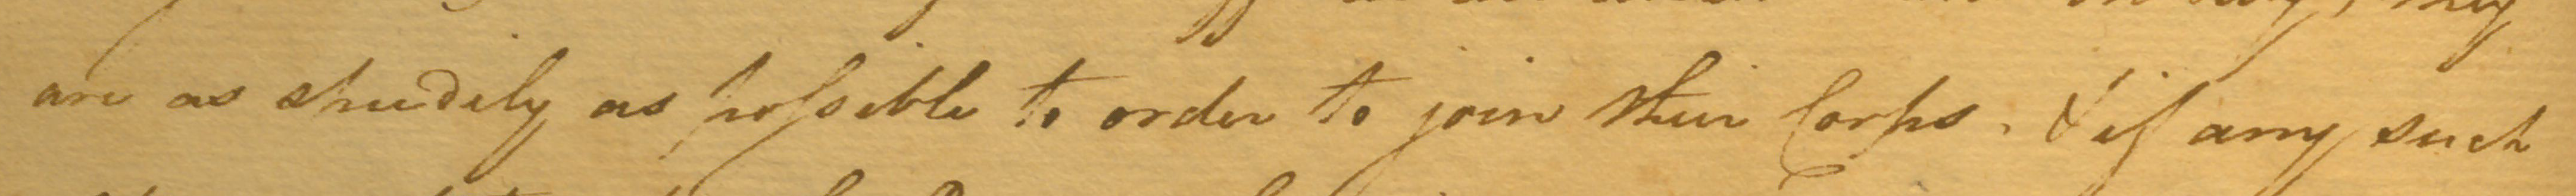are as speedily as possible to order to join their Corps, & if any such
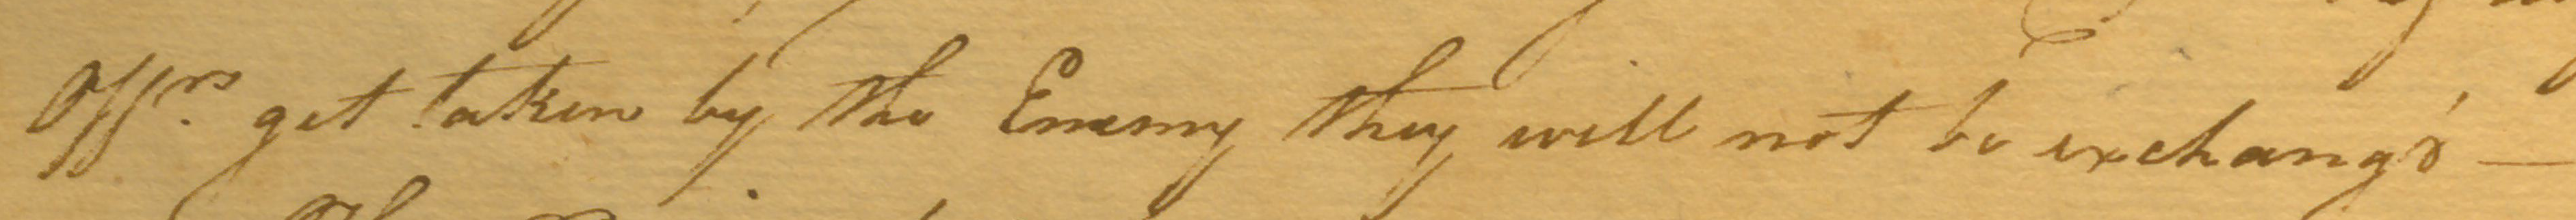Off^rs. get taken by the Enemy they will not be exchang'd-
